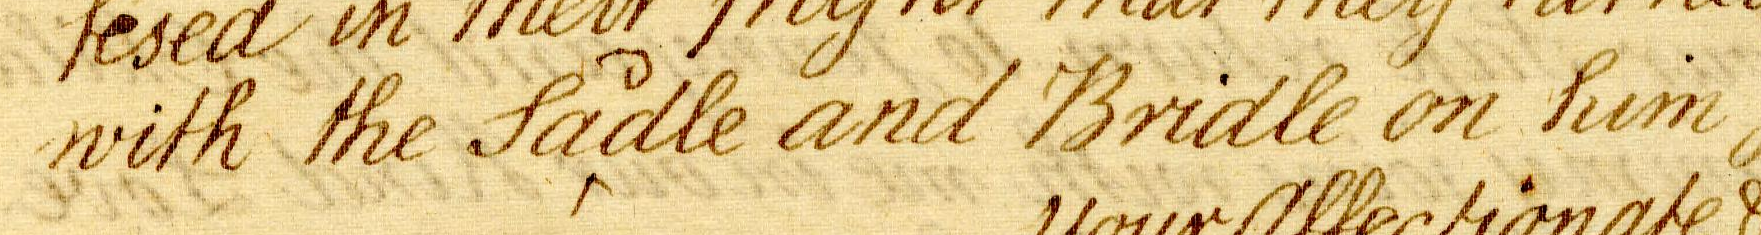with the Sa^ddle and Bridle on him
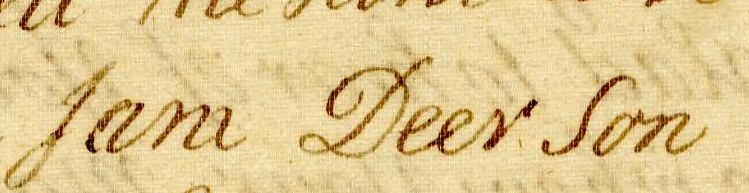I am Deer Son
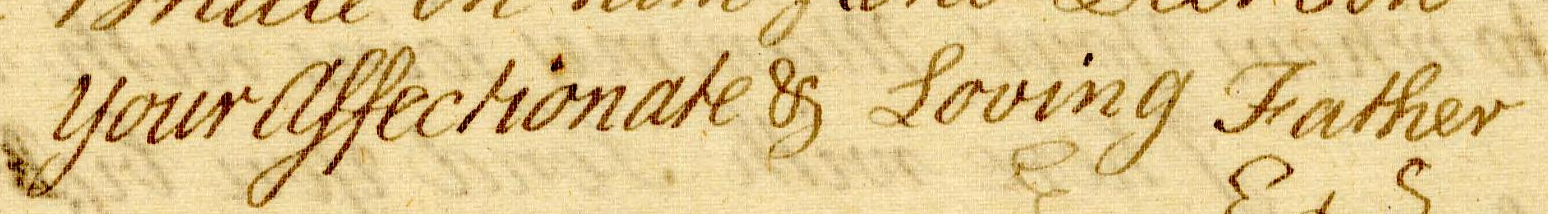Your Affectionate & Loving Father
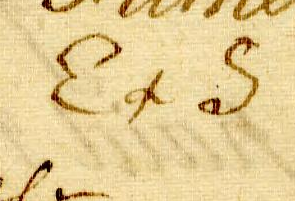E.S
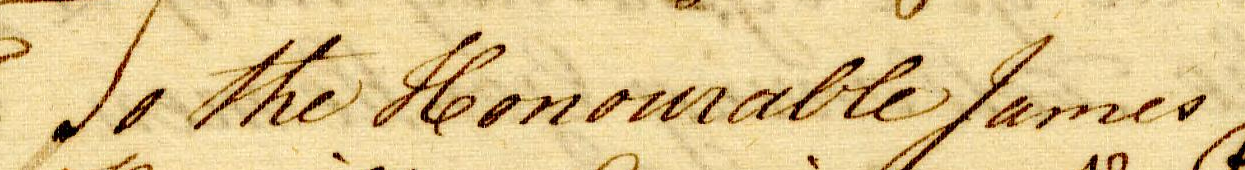To the Honourable James
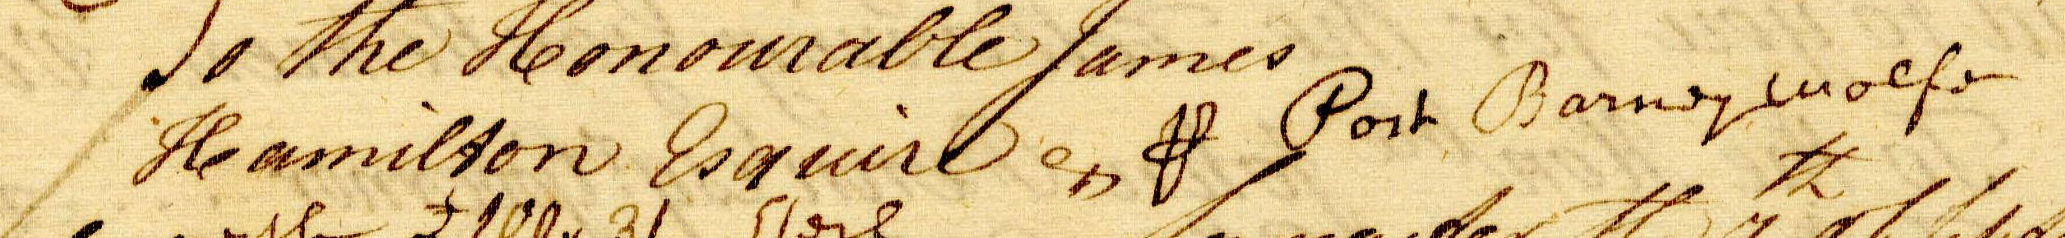Hamilton Esquire, per Post Barney Wolfe-
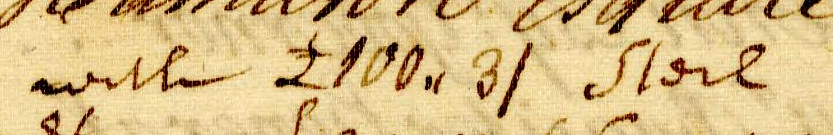with £100.. 3s Sterl
